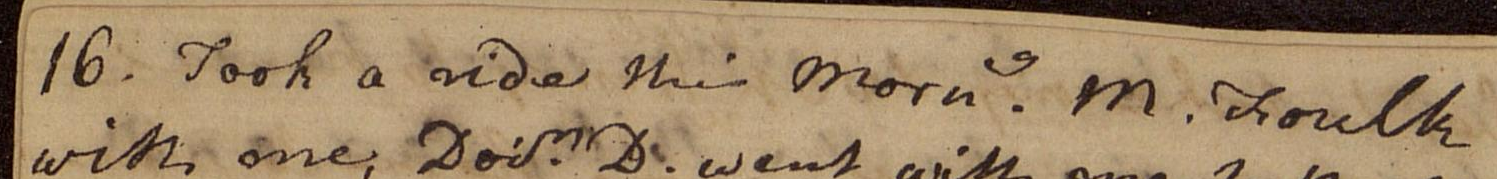16. Took a ride this morn^g. M. Foulk
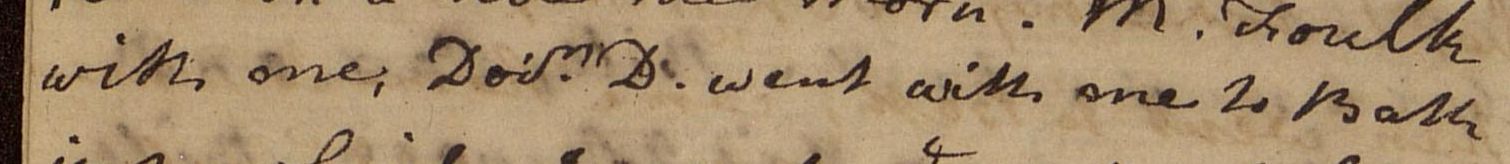with one, Doc^r. D. went with me to Bath
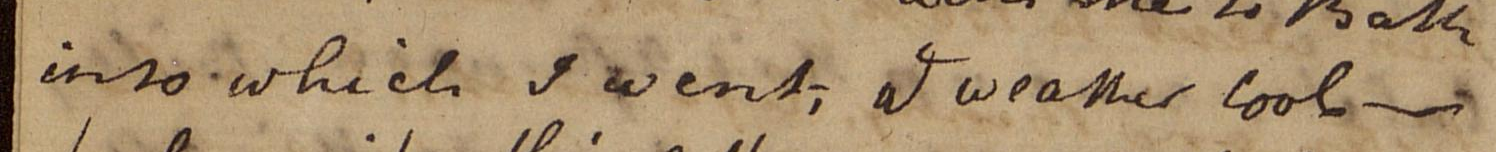into which I went, y^e weather cool-
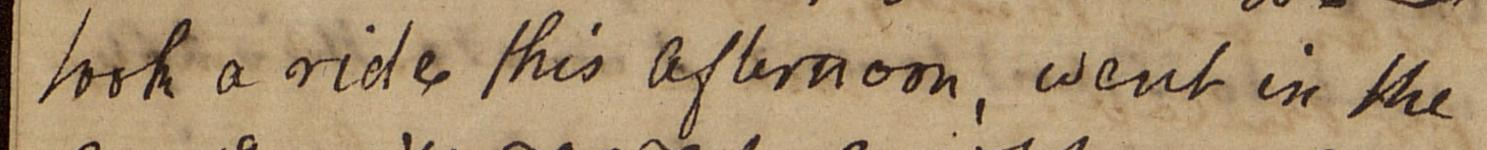took a ride this afternoon, went in the
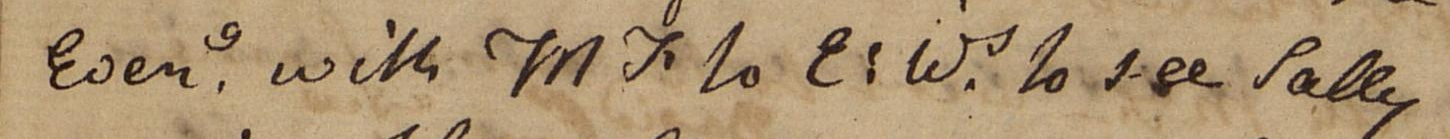Even^g. with M F to E:W^s. to see Sally
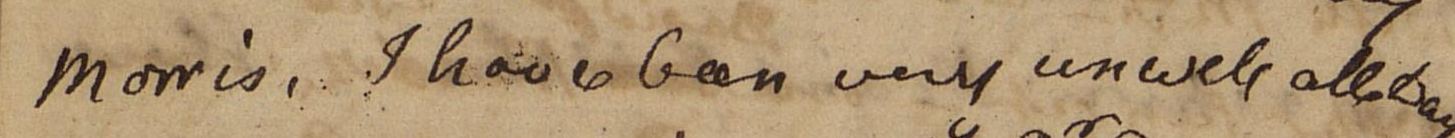Morris, I have been very unwell all Day
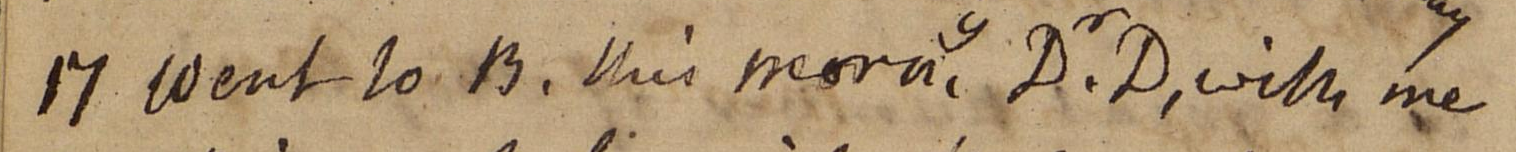11 Went to B. this morn^g. D^r. D, with me
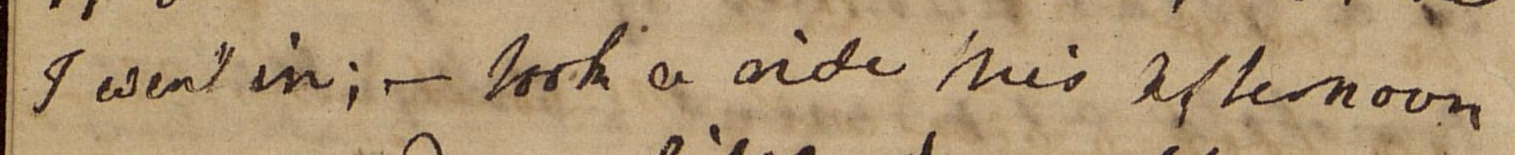I went in;- took a ride this Afternoon
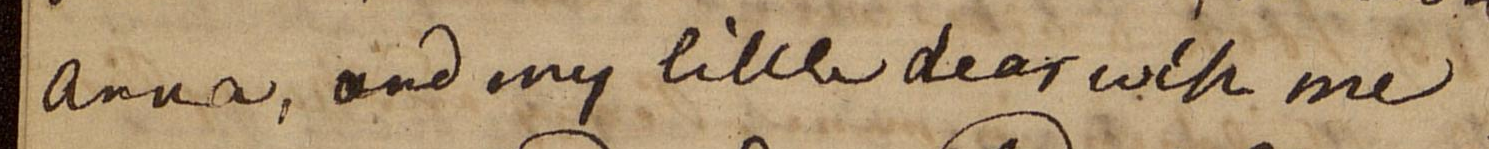Anna, and my little dear with me
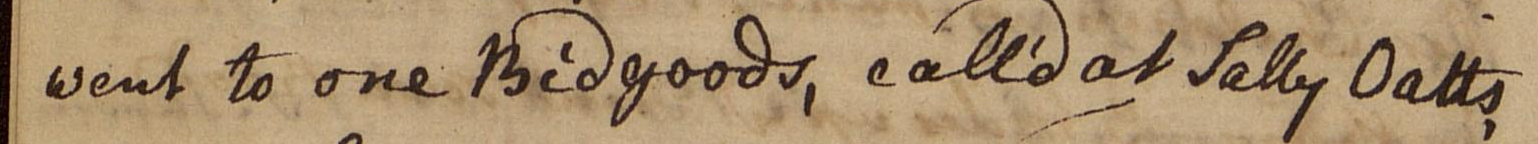went to one Bidgoods, call'd at Sally Oatts,
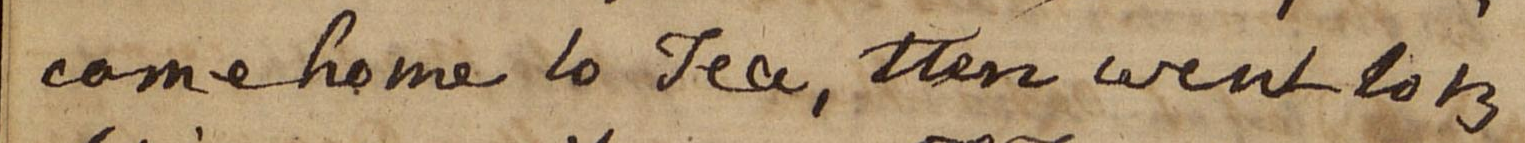came home to Tea, then went to B
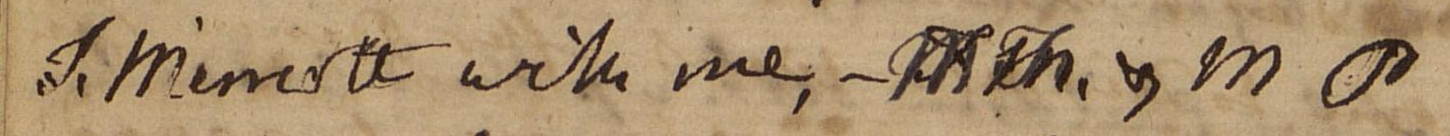S. Merriott with me, - T T, & M P
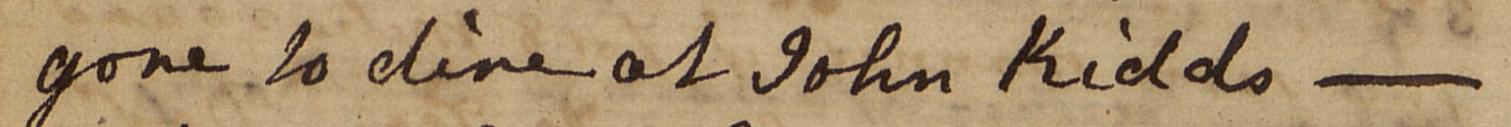gone to dine at John Kidds-
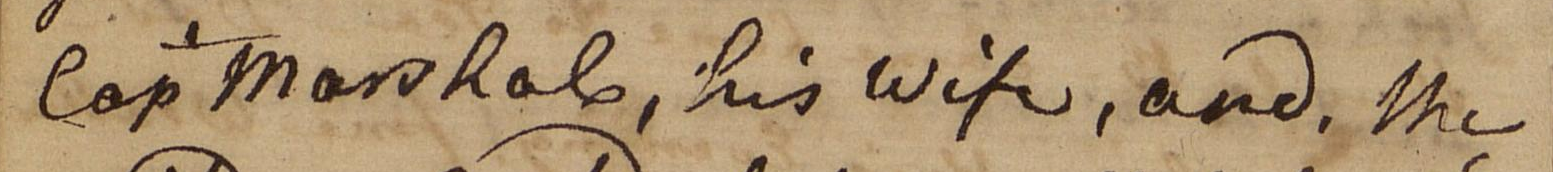Cap^t Marshal, his wife, and, the
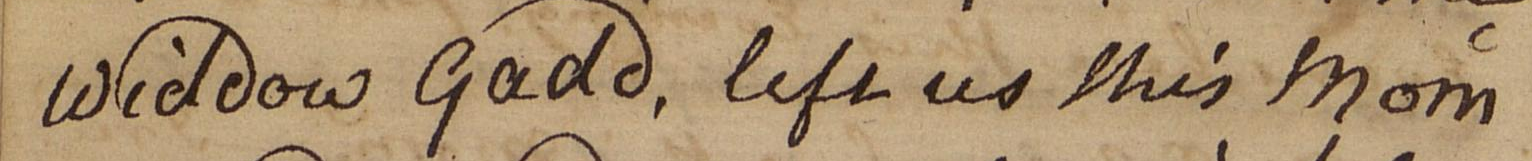Widdow Gadd, left us this Morn^g
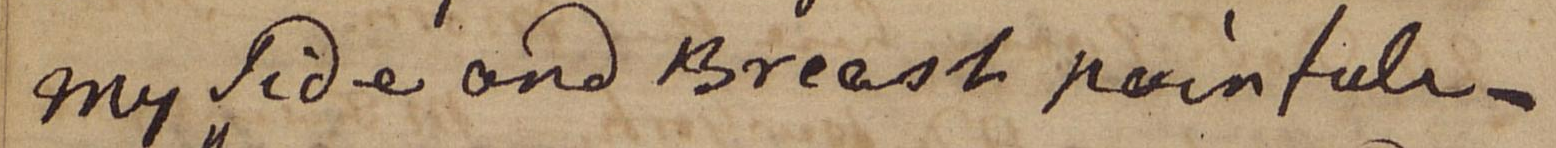my Side and Breast painfull-
